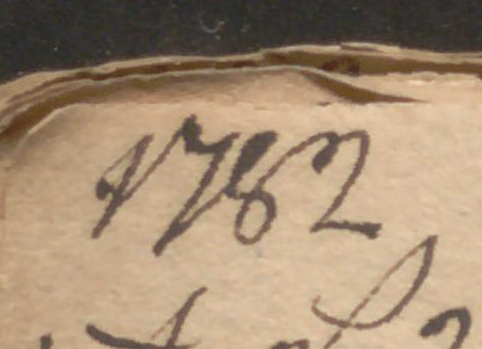1782
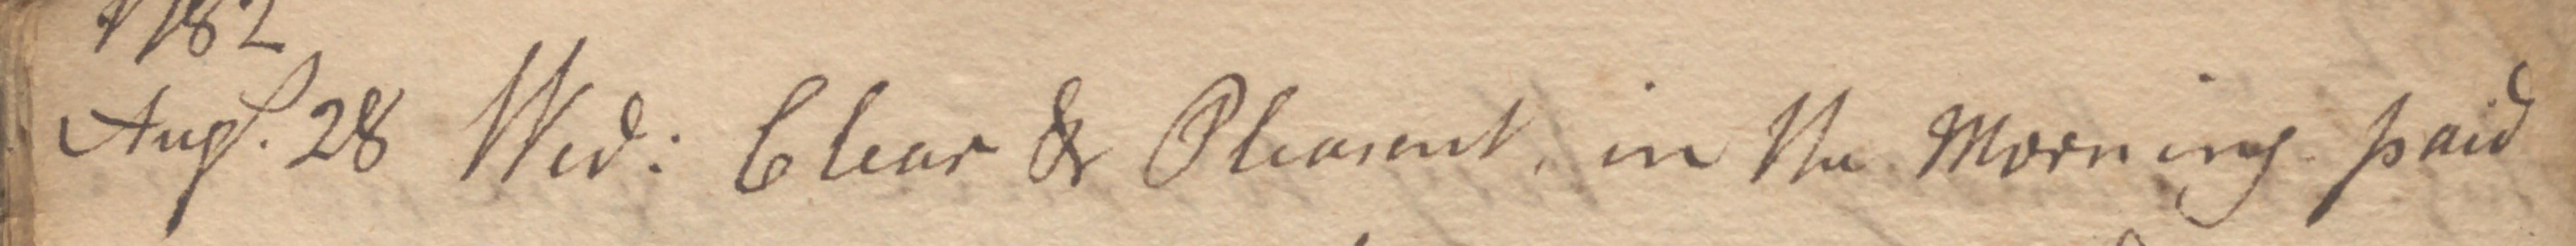Aug^t. 28 Wed: Clear & Pleasent, in the Morning paid
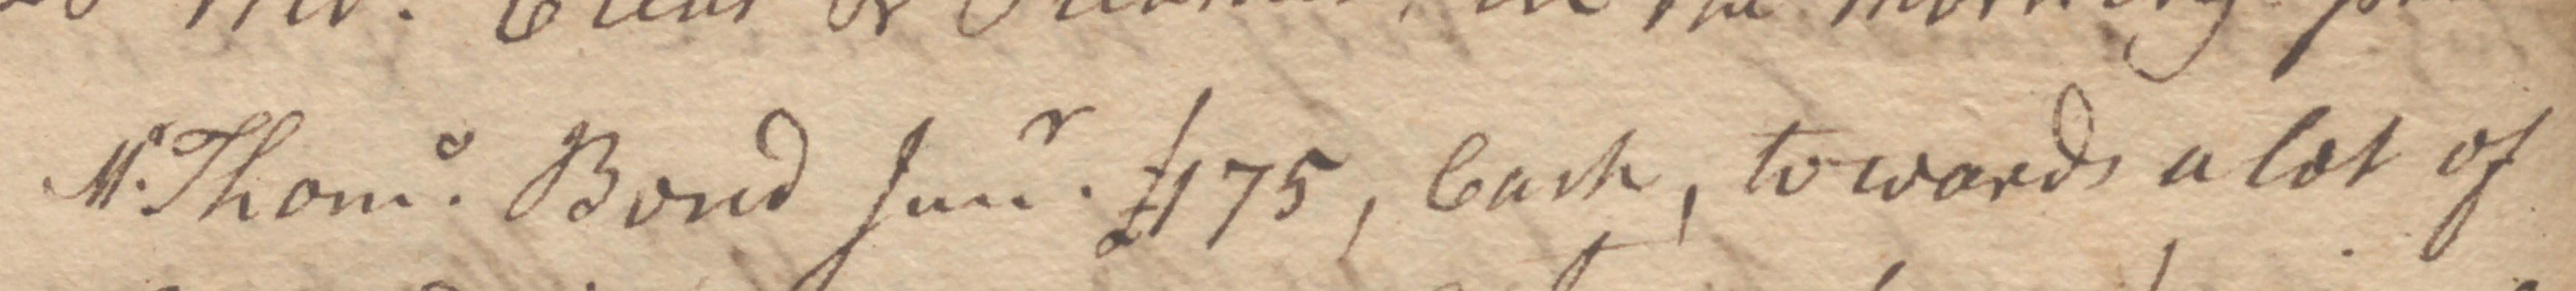M^r. Thom^s. Bond Jun^r. £175, Cask, towards a lot of
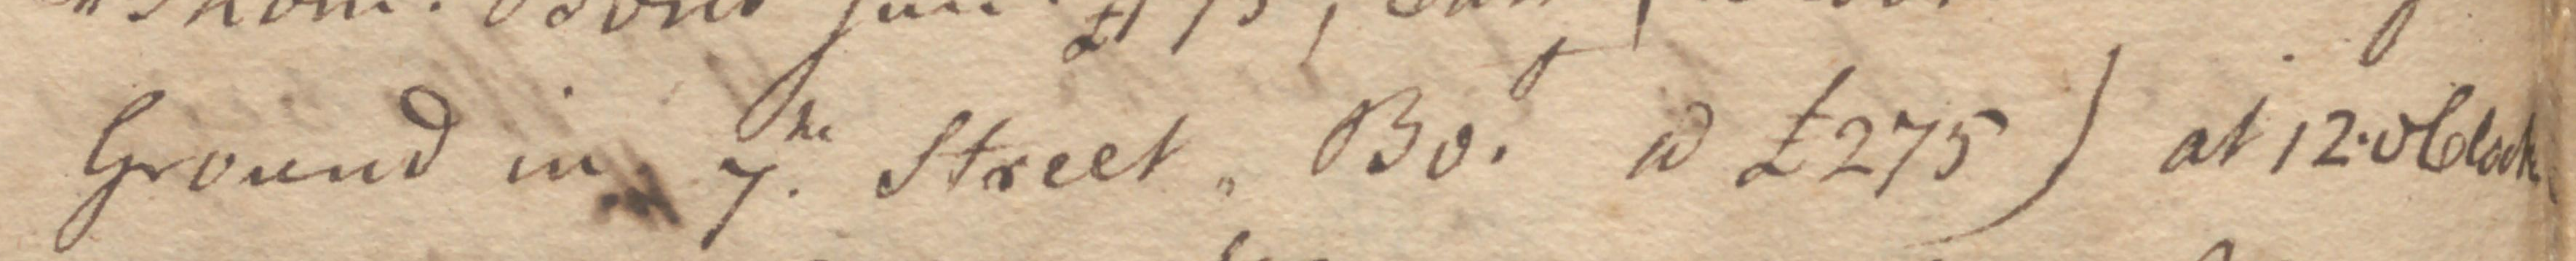Ground in 7^th. Street. Bo^t. @ £275) at 12 oClock
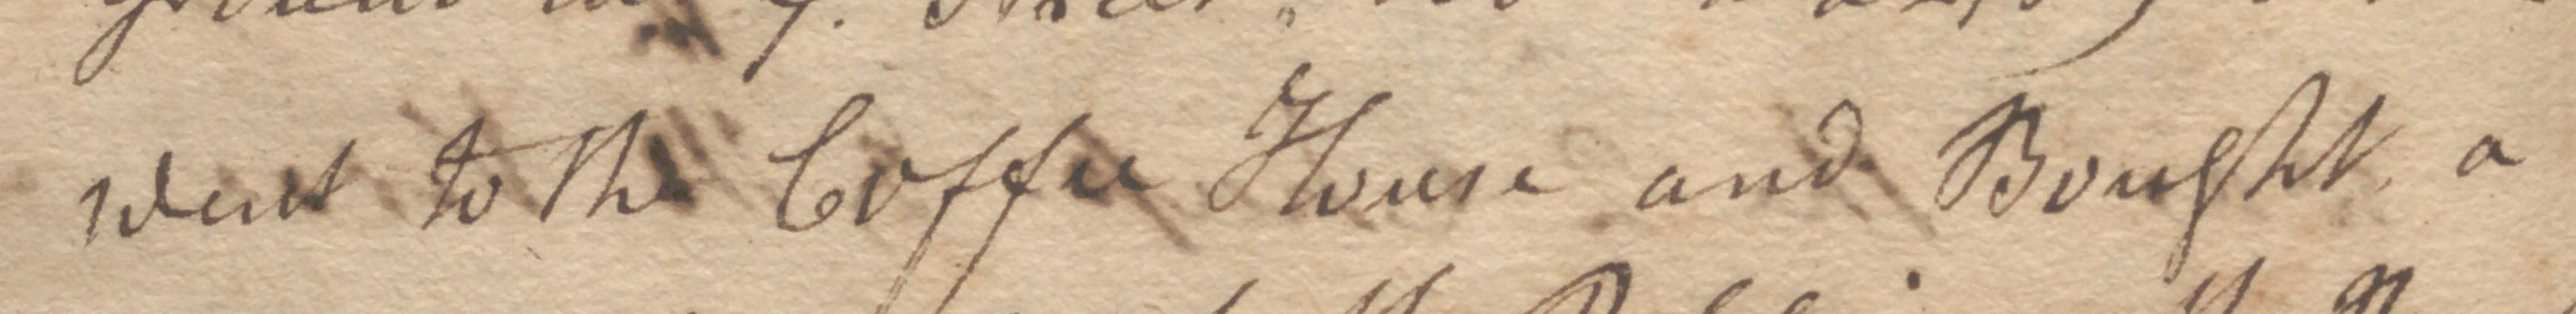went to the Coffee House and Bought a
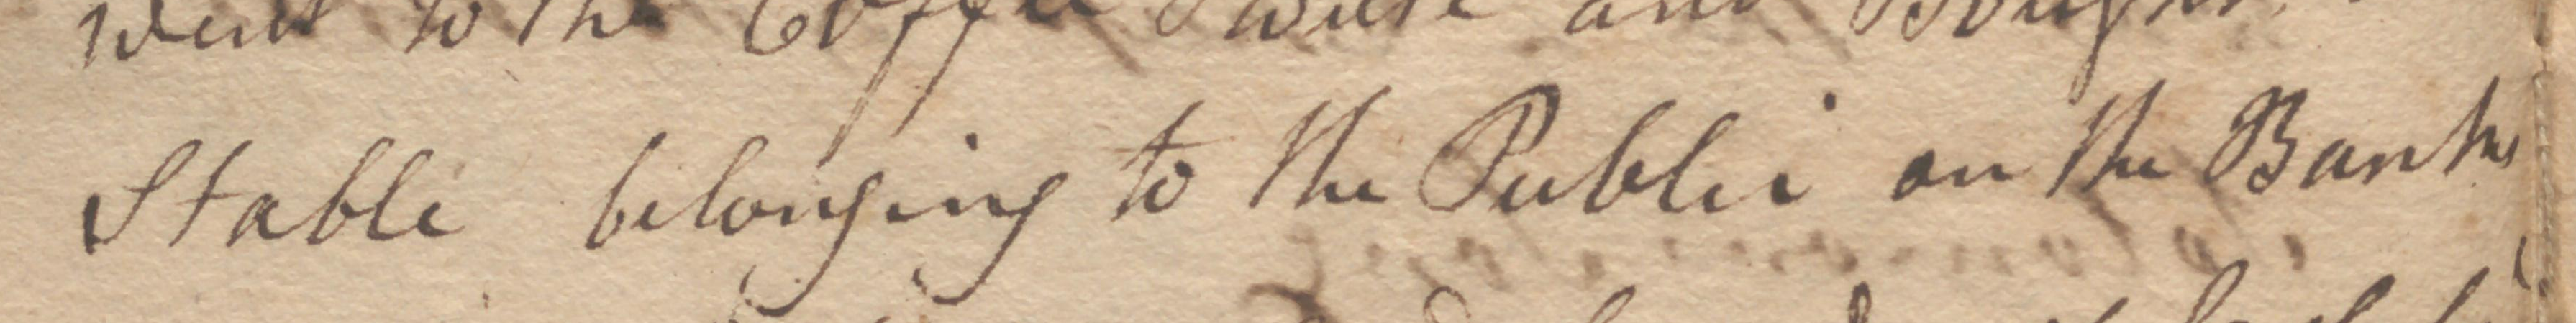Stable belonging to the Public on the Bank
